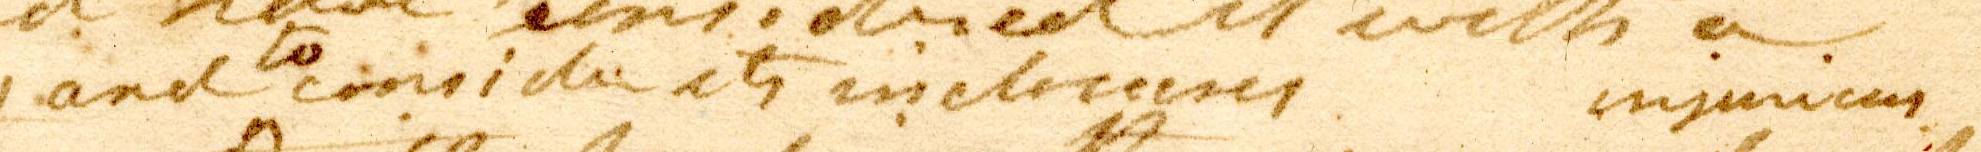and ^to consider its inclocures injurious
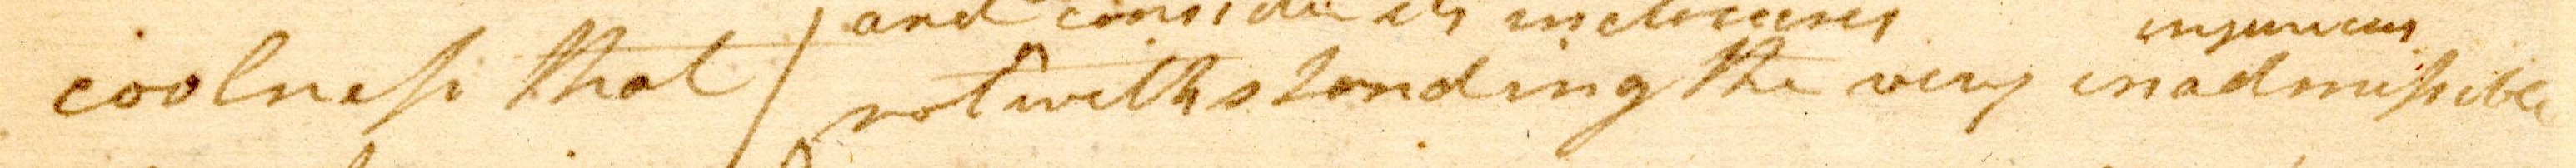coolness that / ^ notwithstanding the very inadmissible
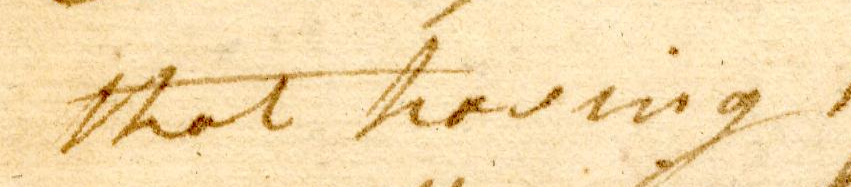that having
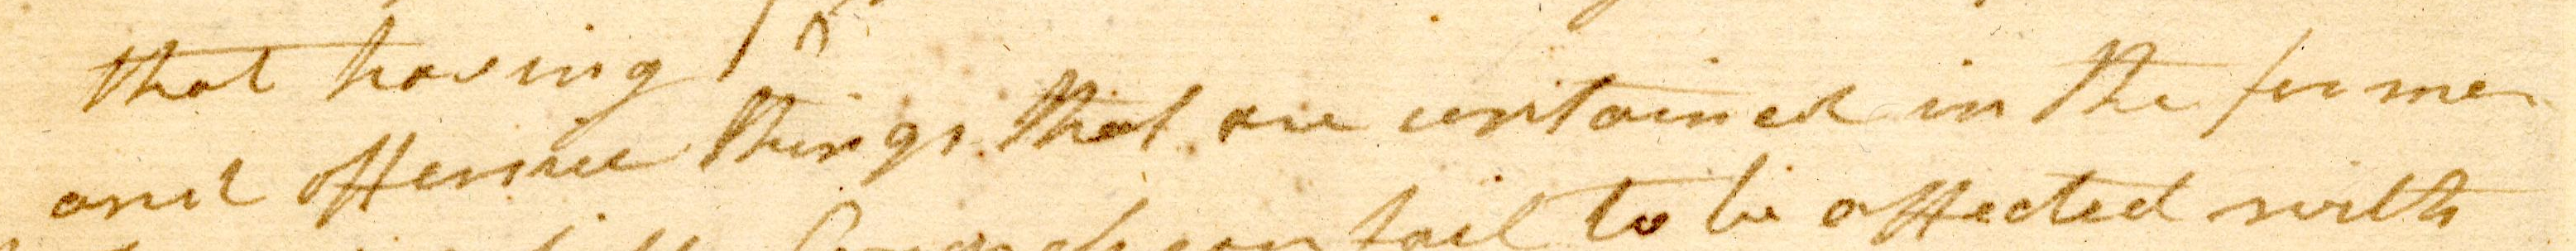and offensive things that are contained in the former
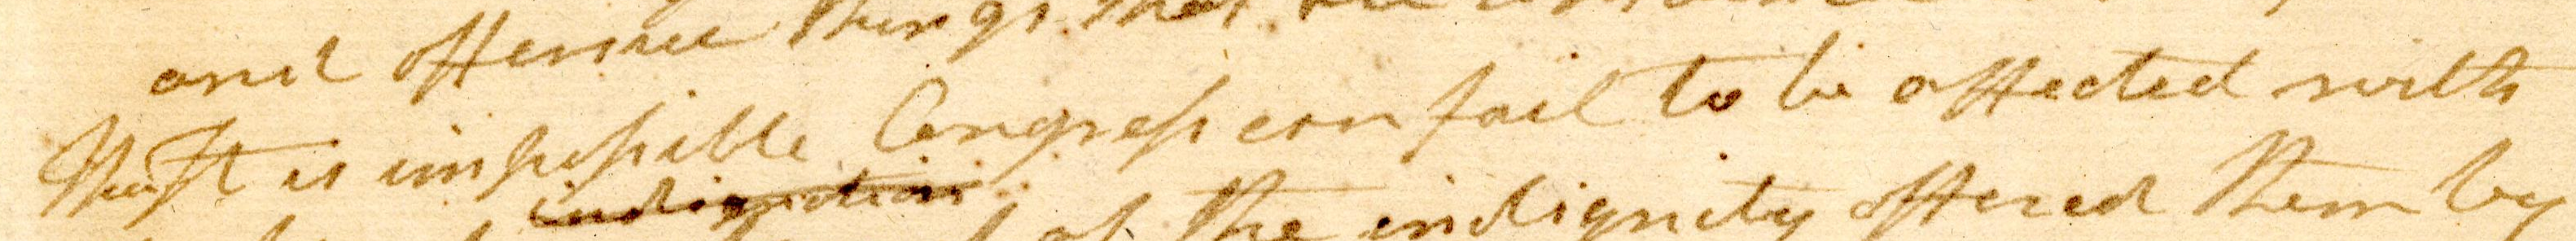Now It is impossible Congress can fail to be affected with
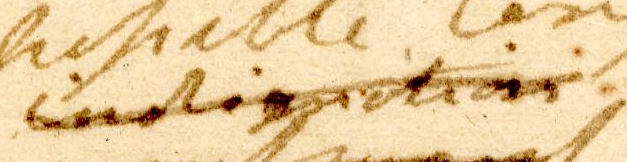[indignation]
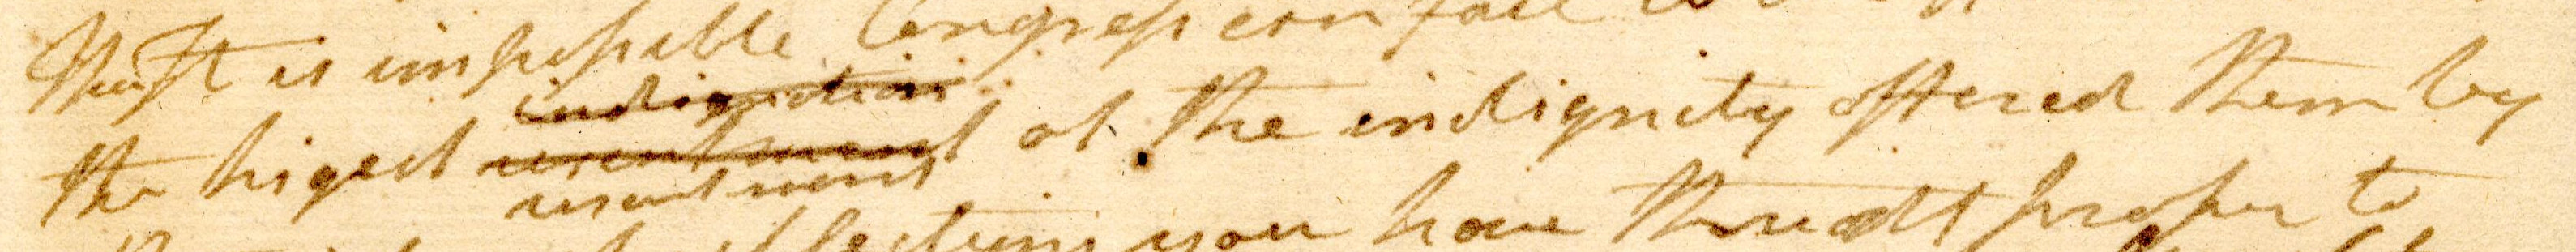the higest [__________] of the indignity offered them by
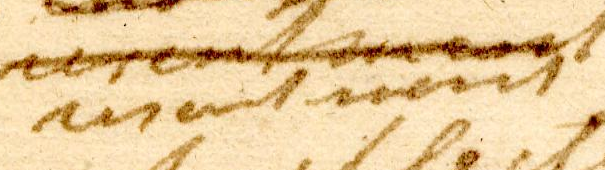resentment
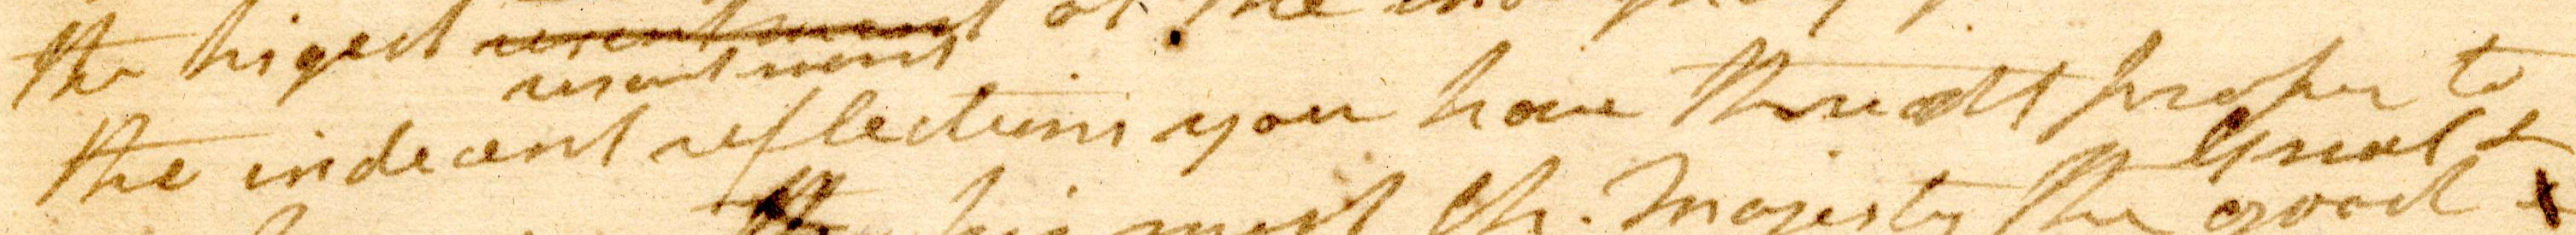the indecent reflections you have thought proper to
